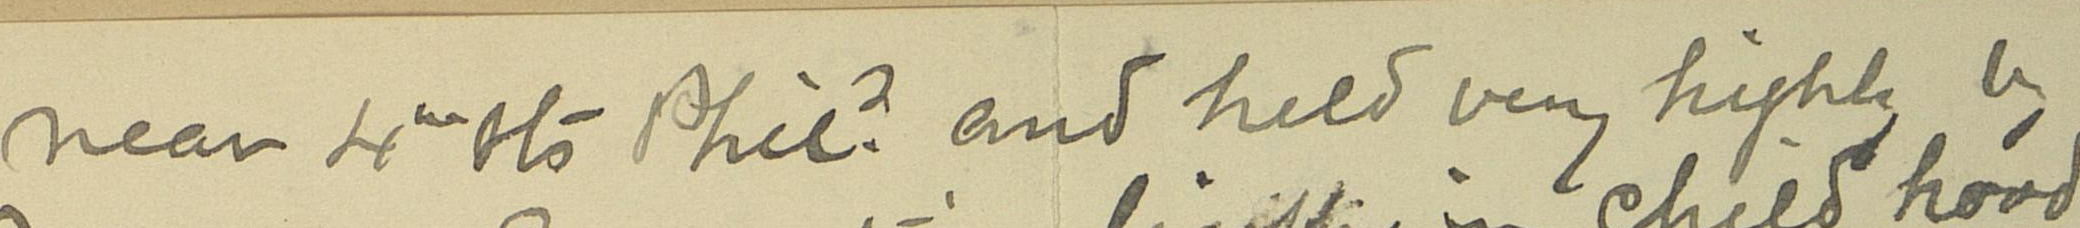near 4^th St. Phil^d and held very highly by
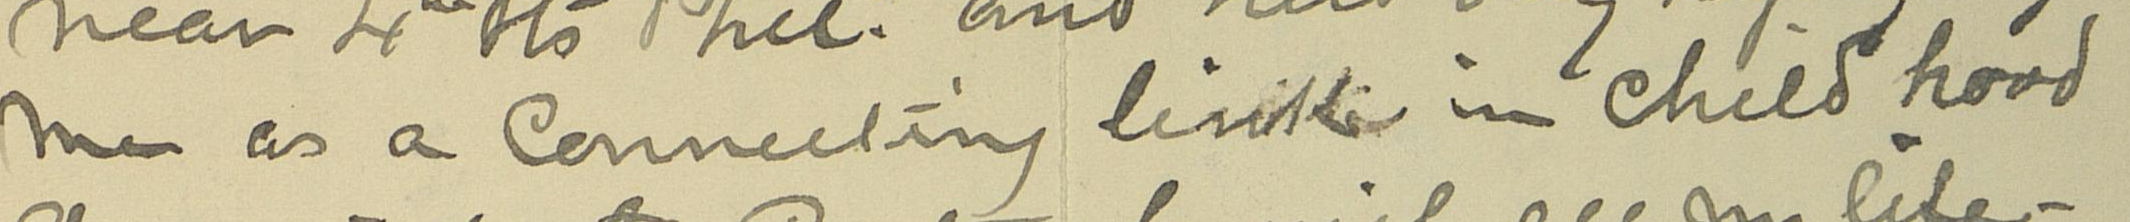me as a Connecting link in child hood
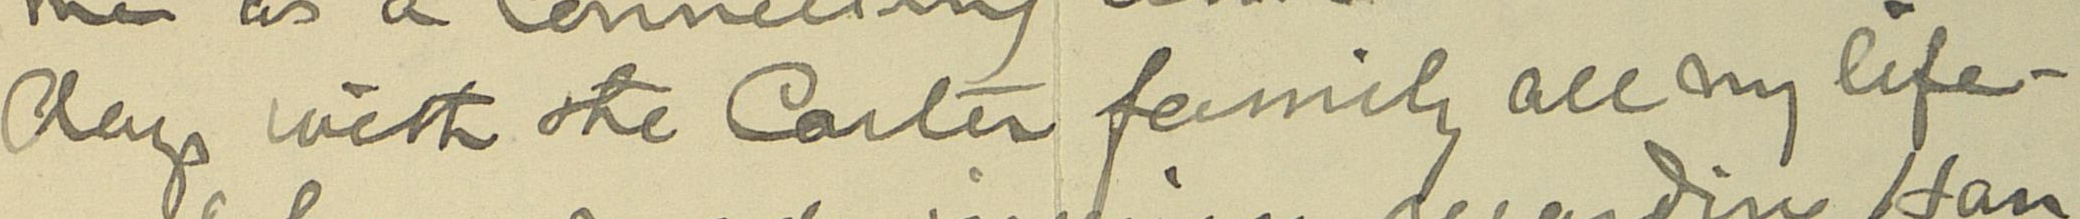days with the Carter family all my life.
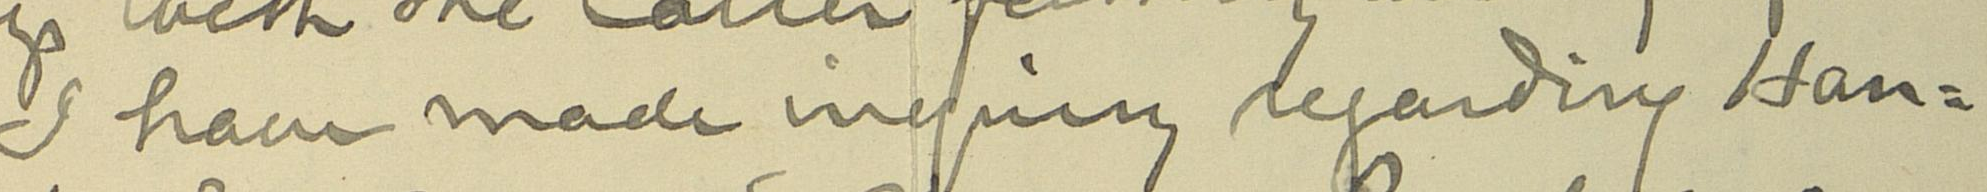I have made inquiry regarding Han-
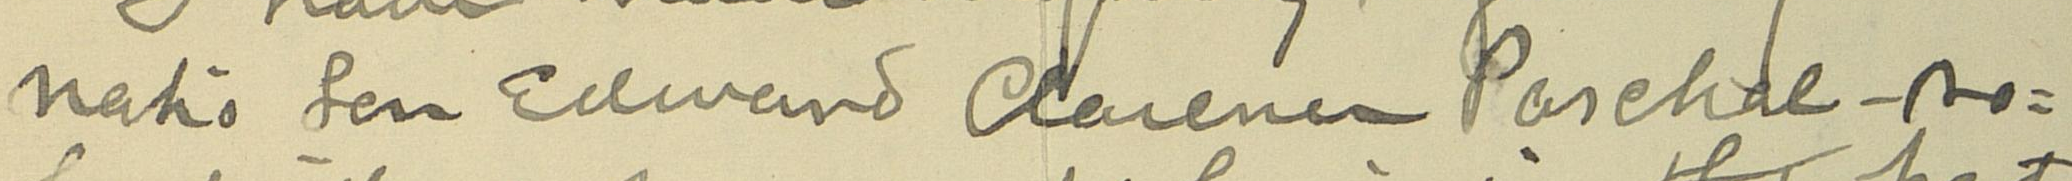-nak'o Ien Edward Clarence Paschal so-
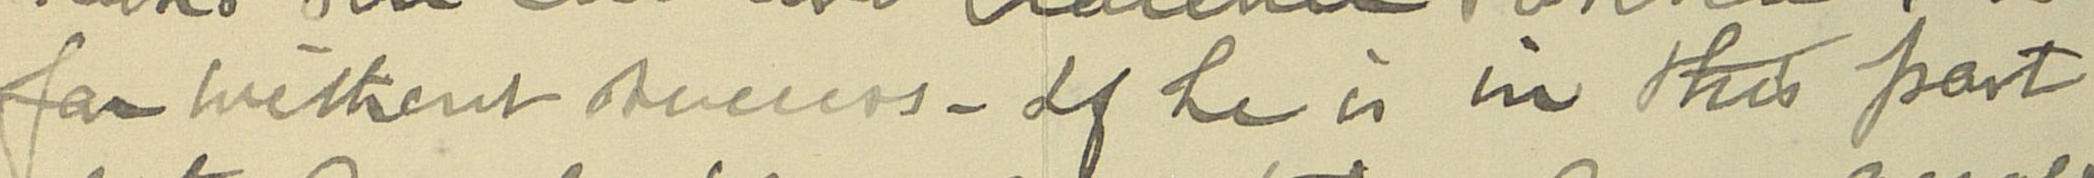far without success. If he is in this part
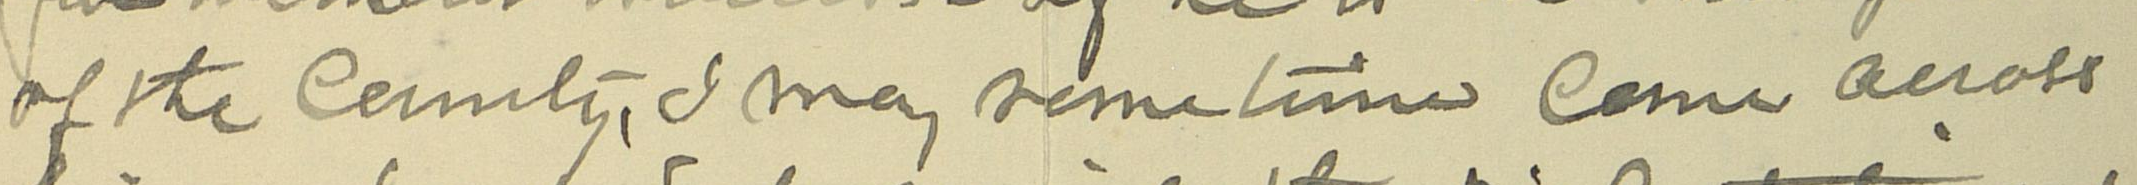of the County, I may sometime Come across
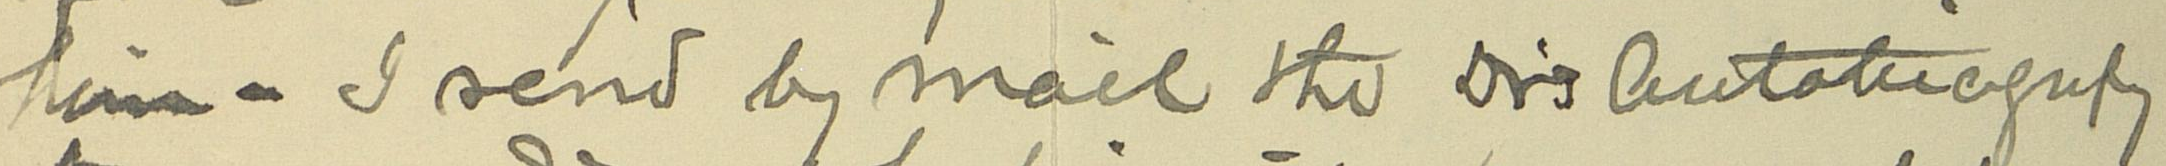him. I send by mail the D^r's Autobiography
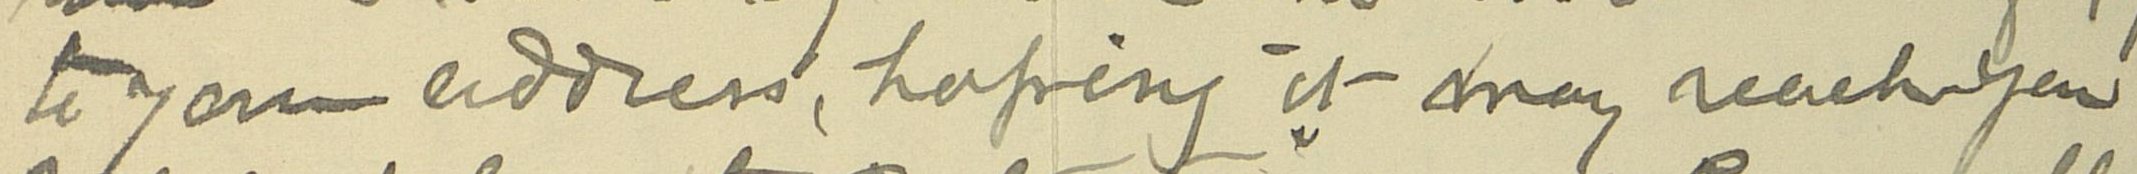to your address, hoping it may reach you
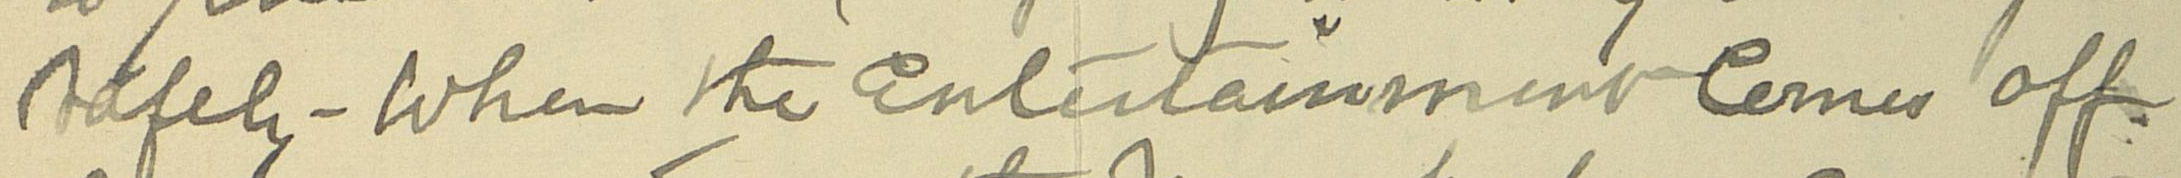safely. When the Entertainment Comes off
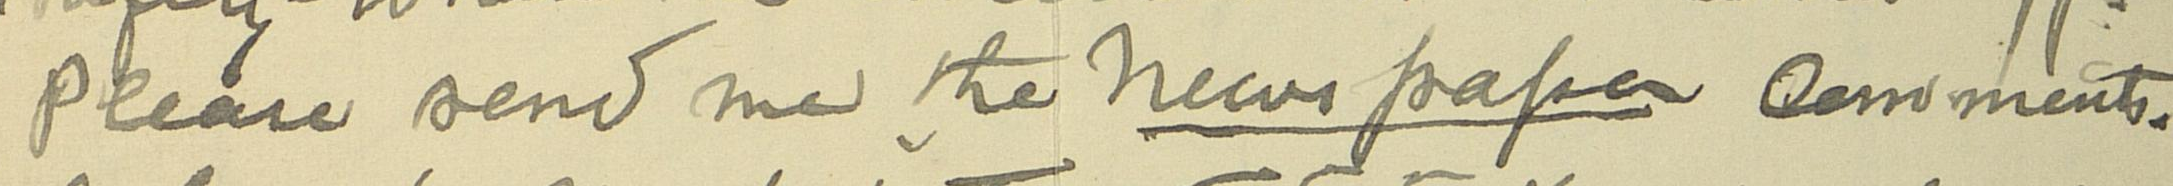Please send me the news paper Comments.
